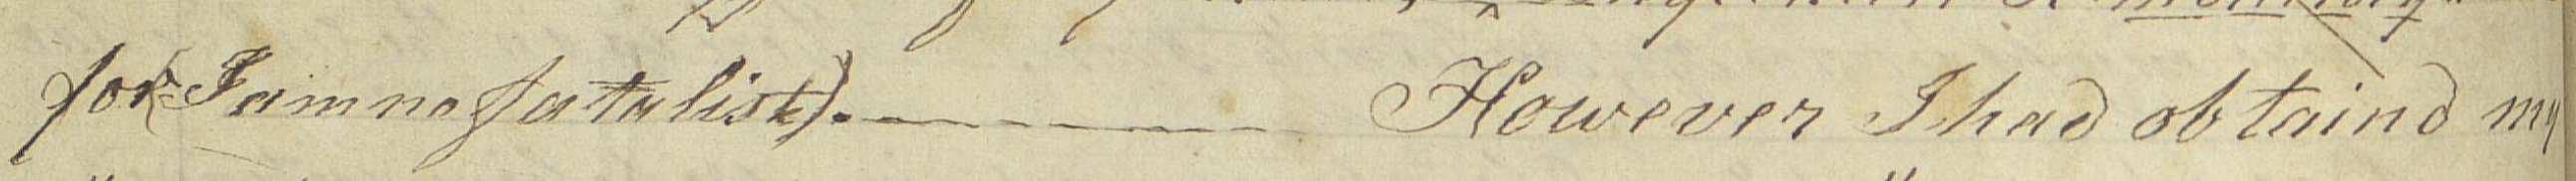for I am no fatalist. However I had obtaind my
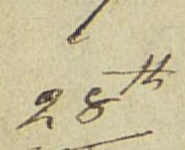28^th
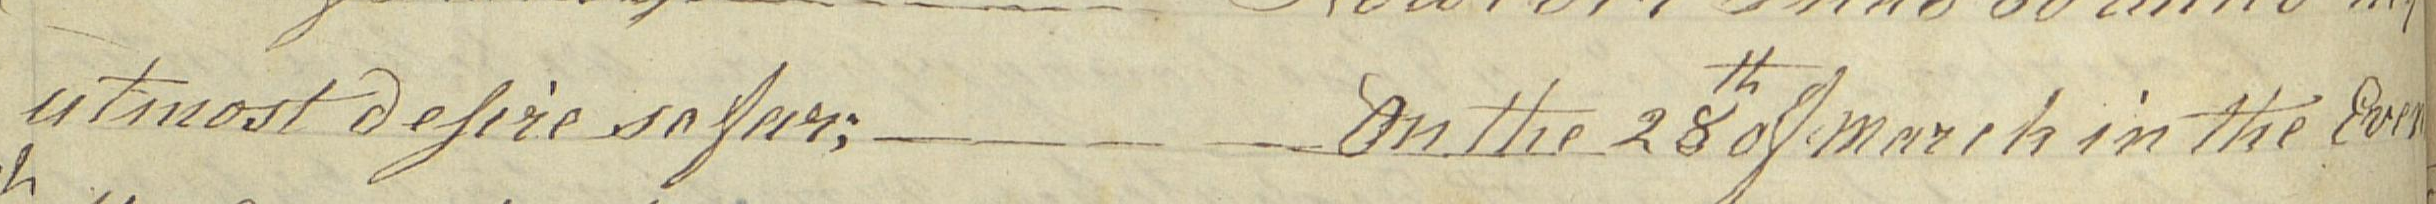utmost desire so far; On the 28^th of march in the Eve-
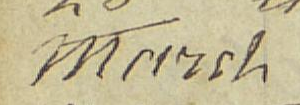March
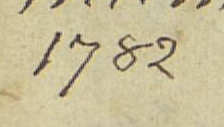1782
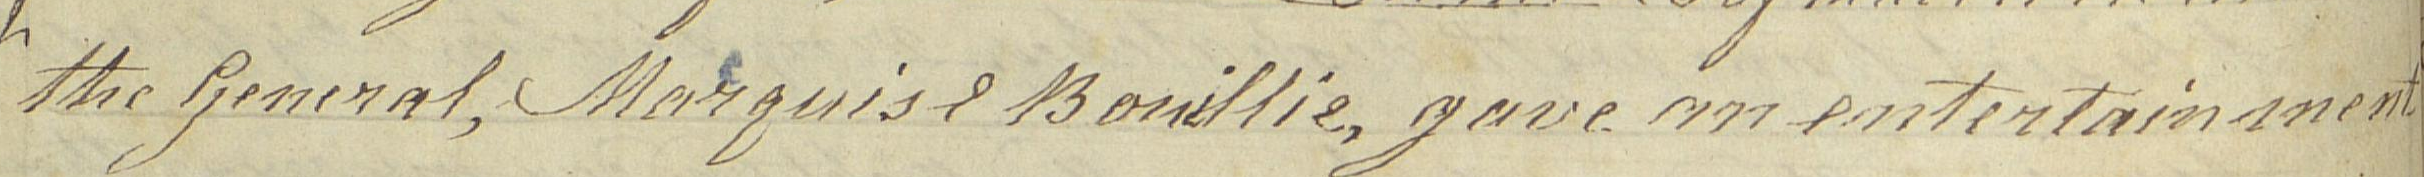the General, Marquis E Boullie, gave in entertainment
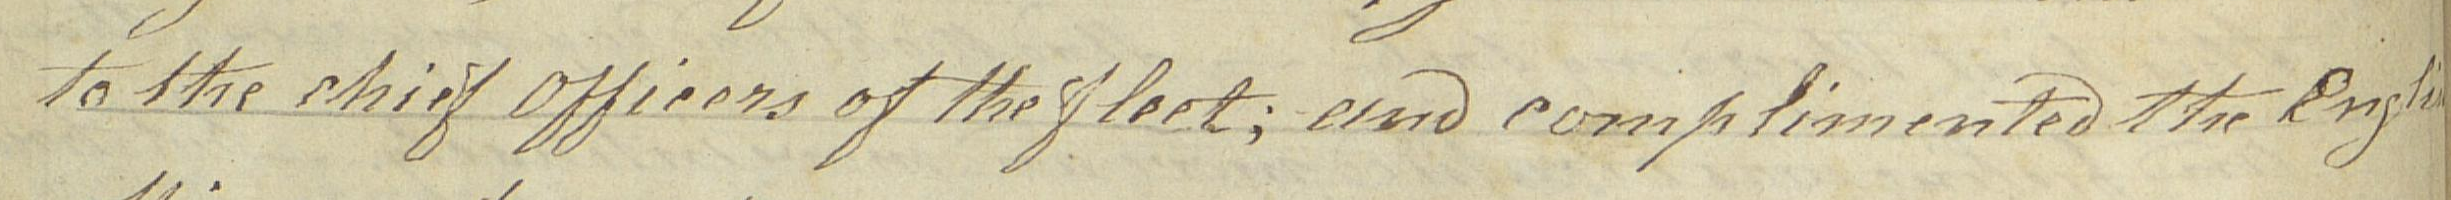to the chief Officers of the fleet; and complimented the Engl-
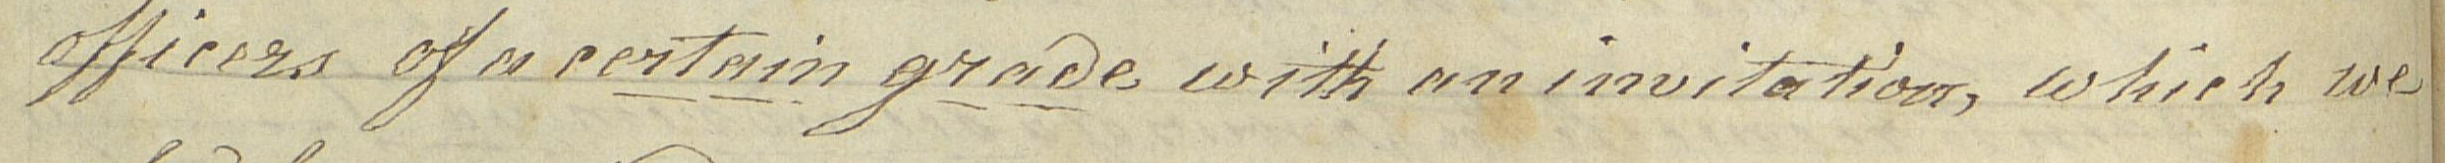officers of a certain grade with an invitation, which we
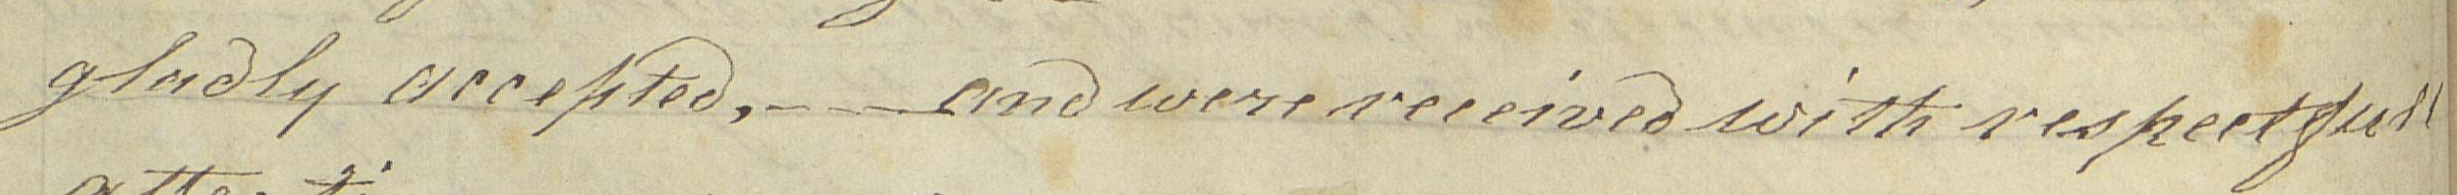gladly accepted, and were received with respect full
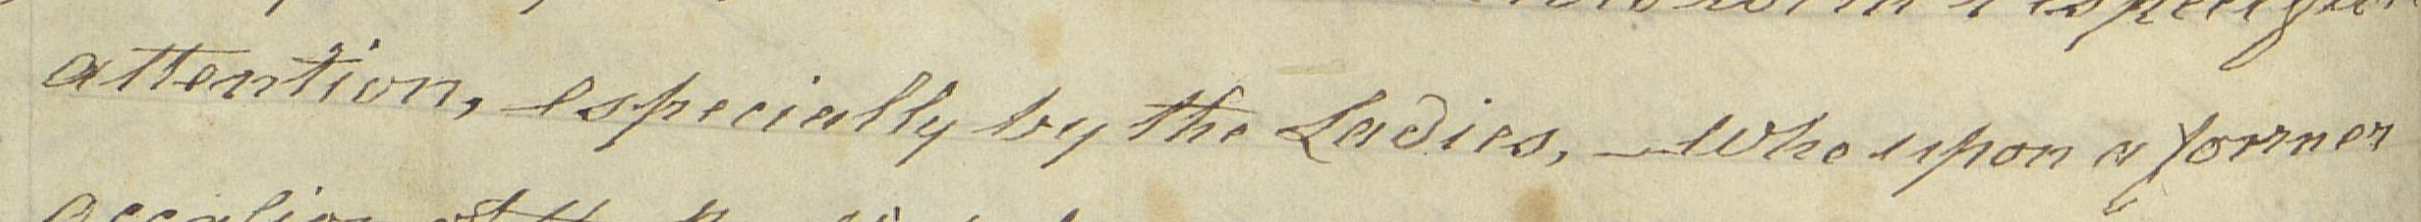attention, especially by the Ladies, who upon a former
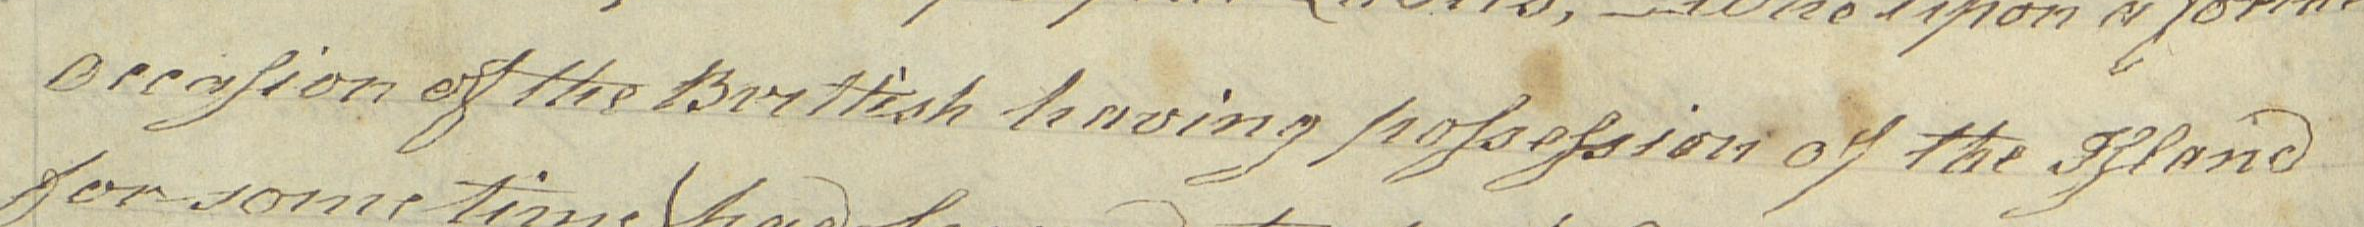occasion of the Brittish having possession of the Island
